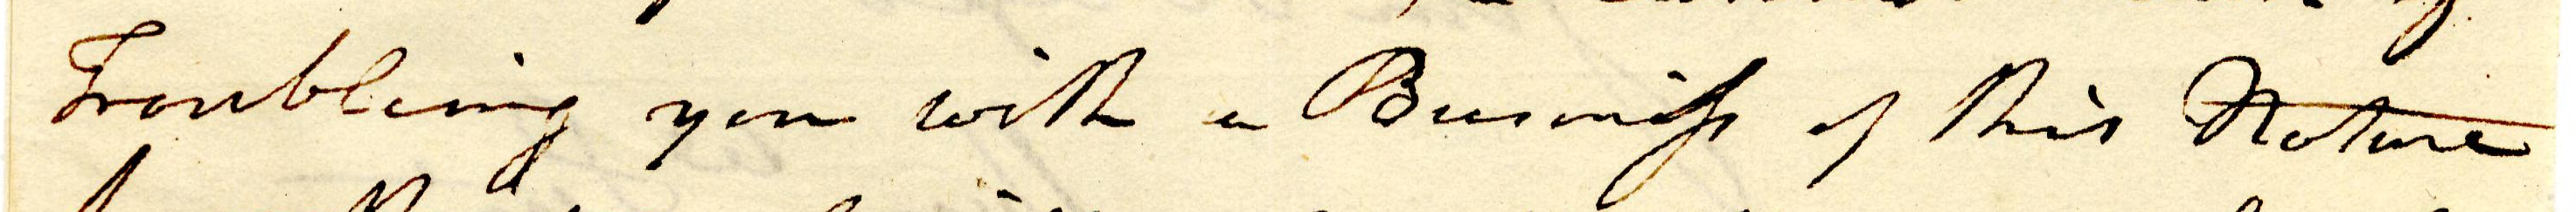Troubling you with a Business of this Nature
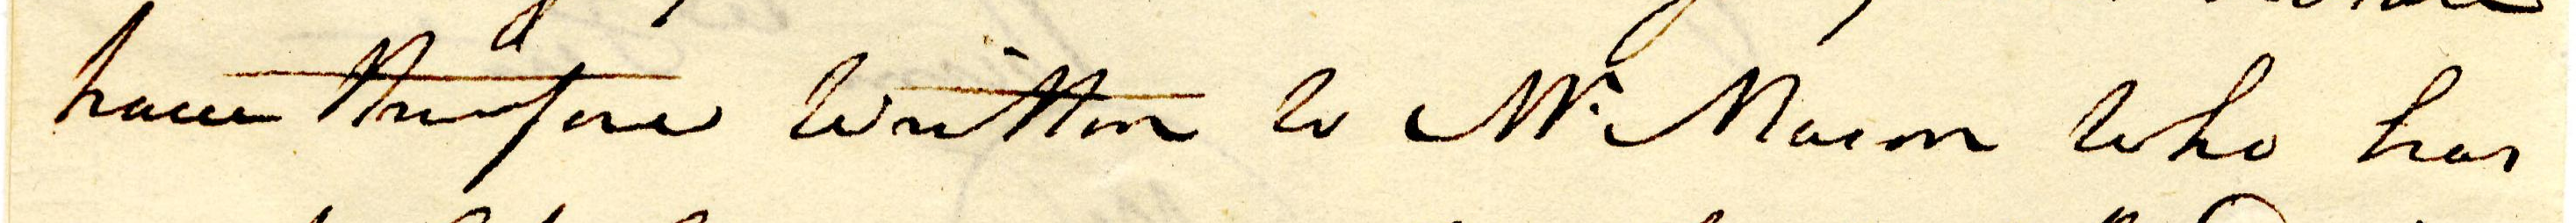have therefore Written to M^r. Mason who has
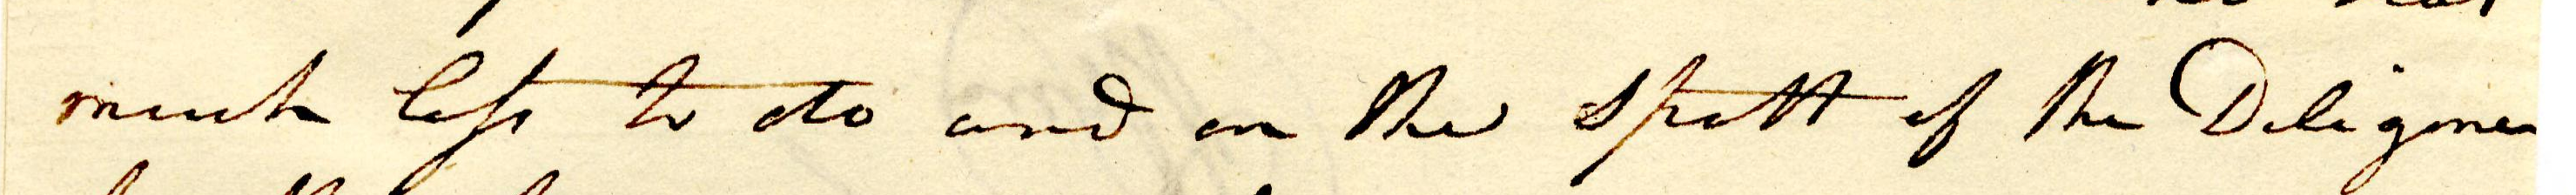much less to do and on the spott of the Diligence
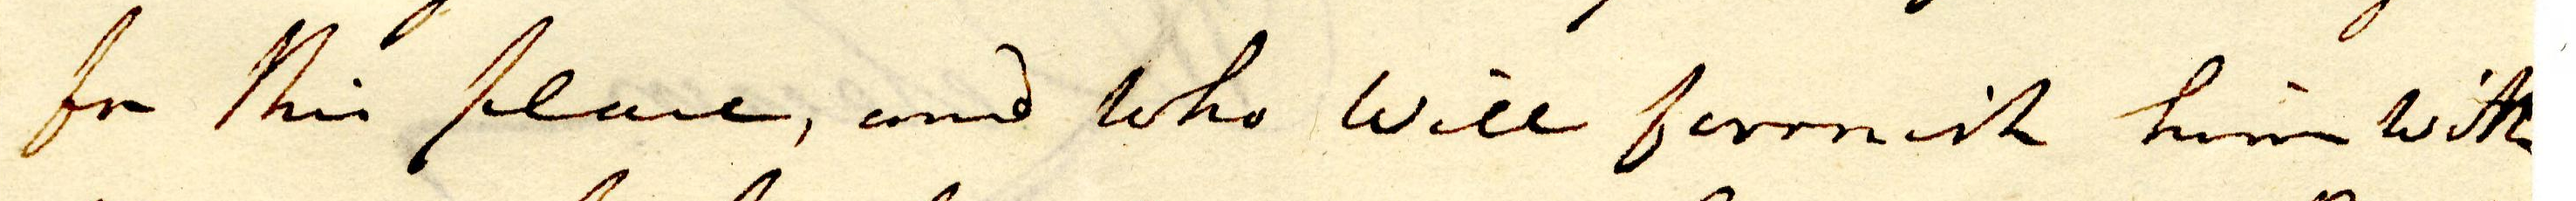for this place, and who will furnish him with
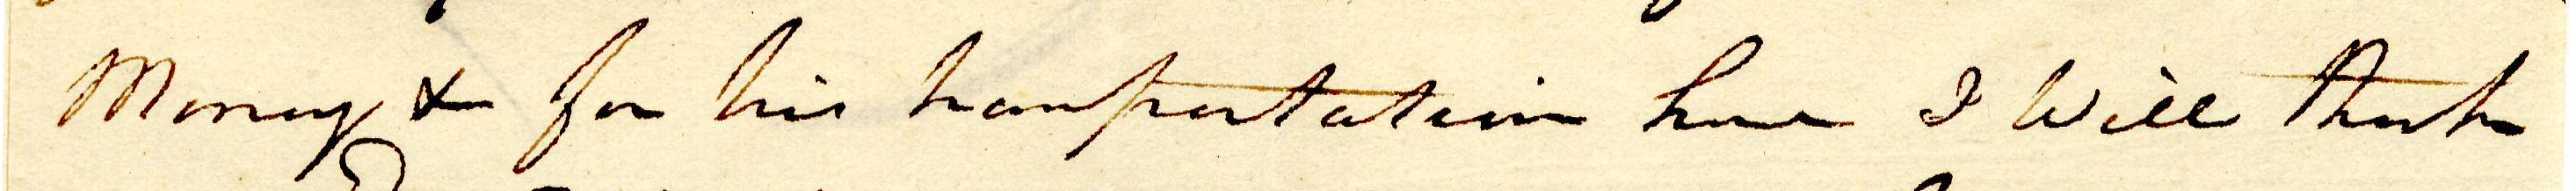Money & for his transportation here I will thank
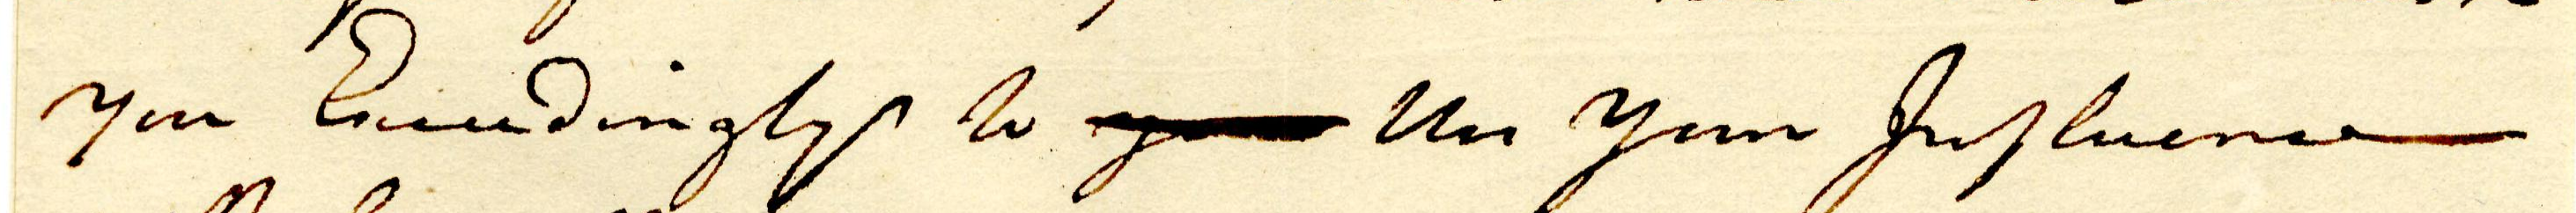you Exceedingly to [____] Use your Influence
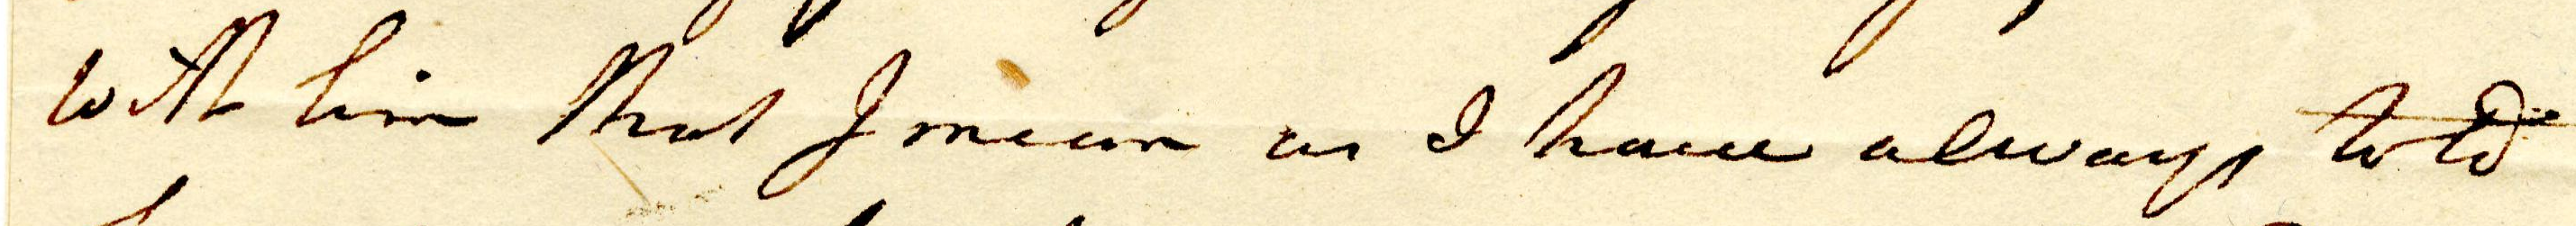with him that I mean as I have always told
